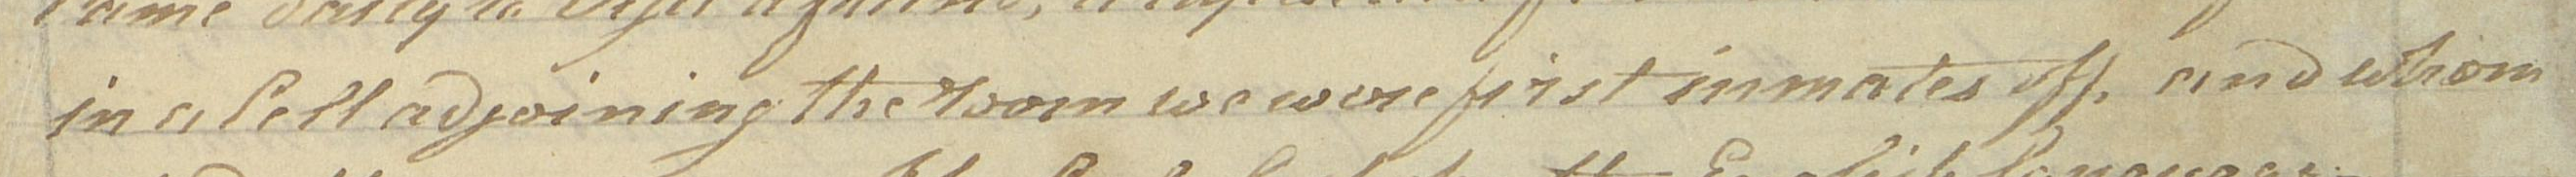in a Cell adjoining the room we were first inmates off, and whom
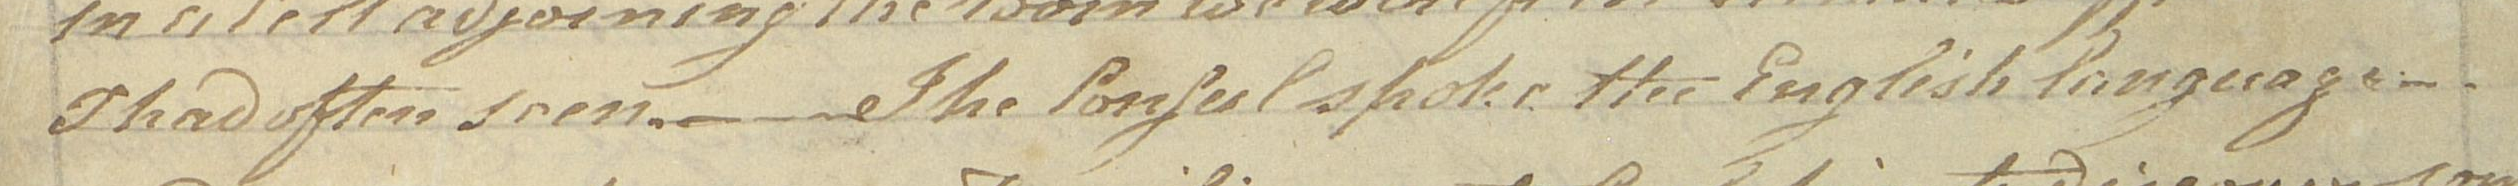I had often seen. The Consul spoke the English language
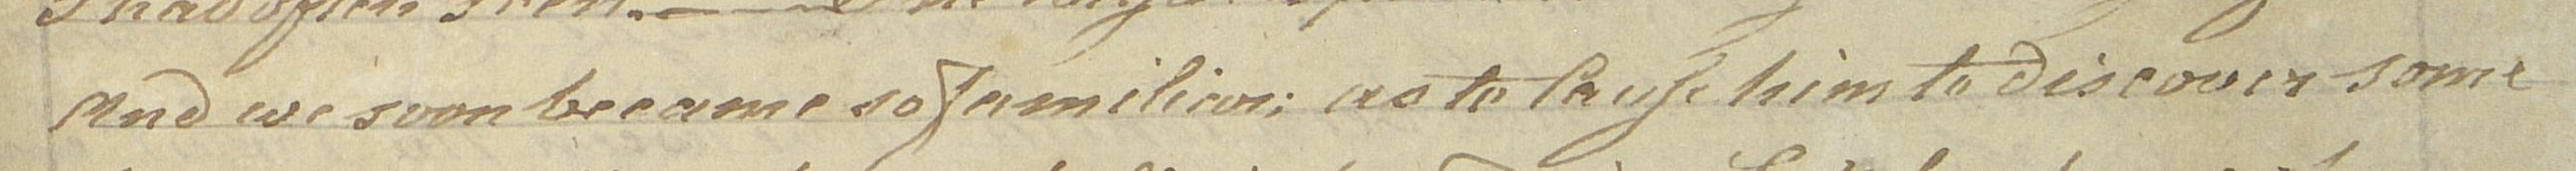And we soon became so familiar; as to Cause him to discover some
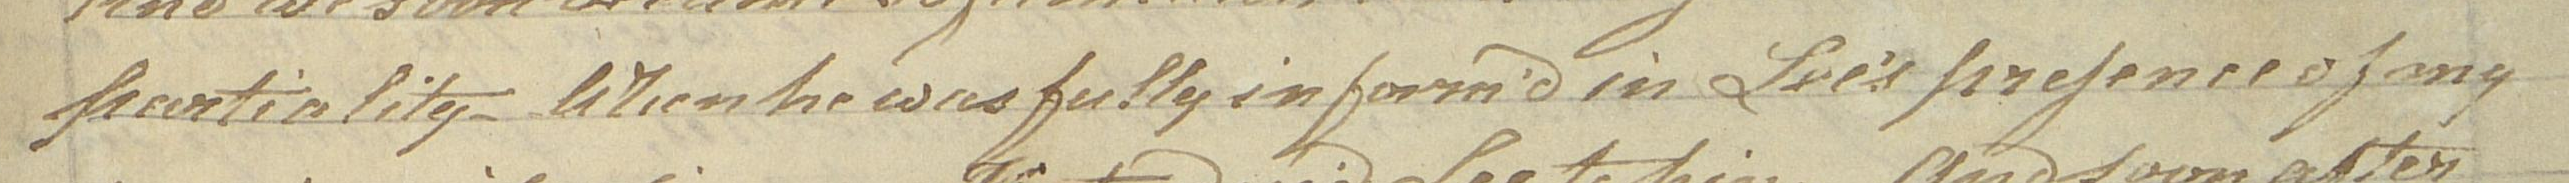partiality. When he was fully inform'd in Lee's presence of my
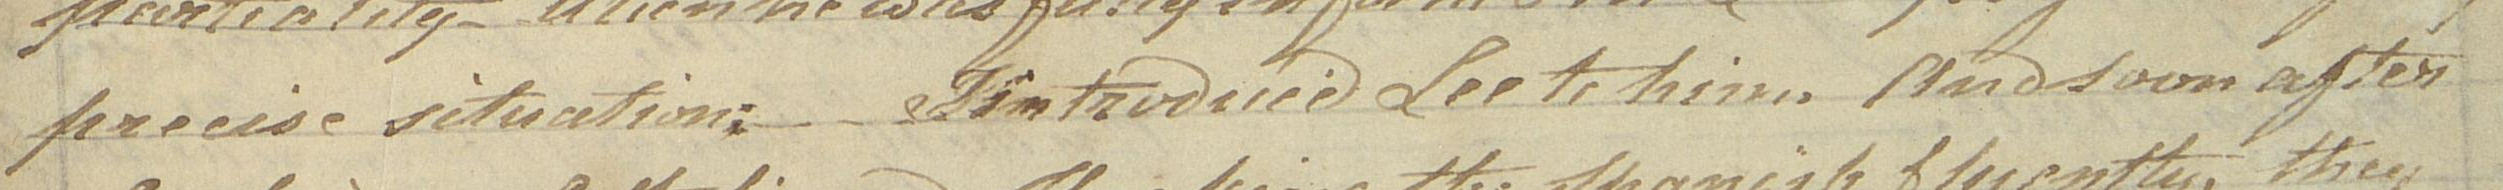precise situation: I introduc'd Lee to him And soon after
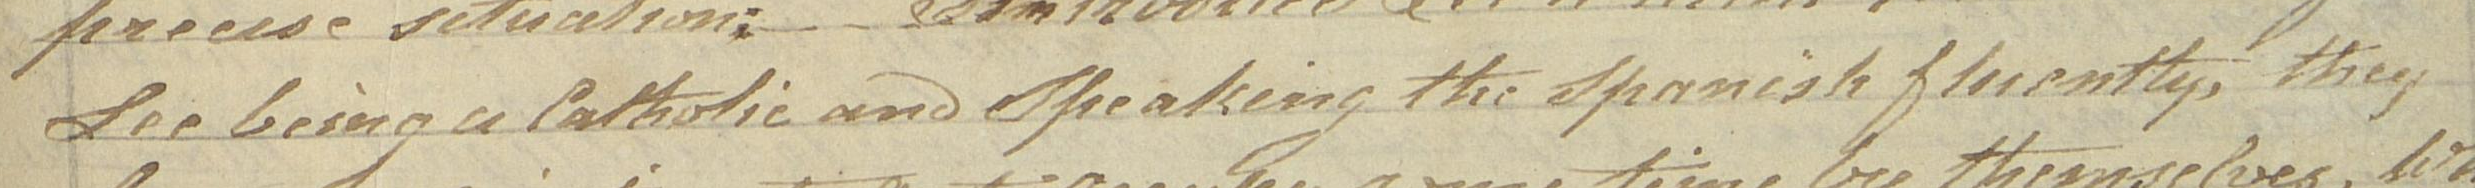Lee being a Catholic and Speaking the spanish fluently, they
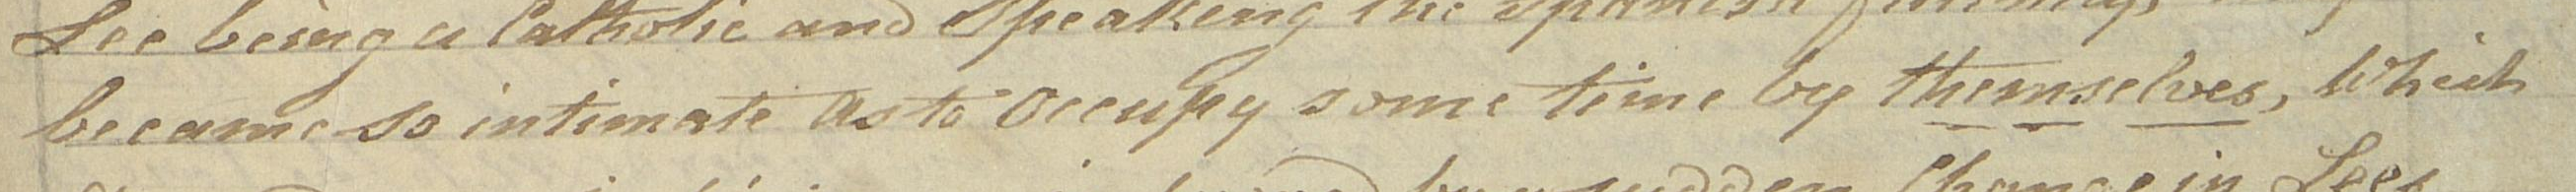became so intimate as to occupy some time by themselves, Which
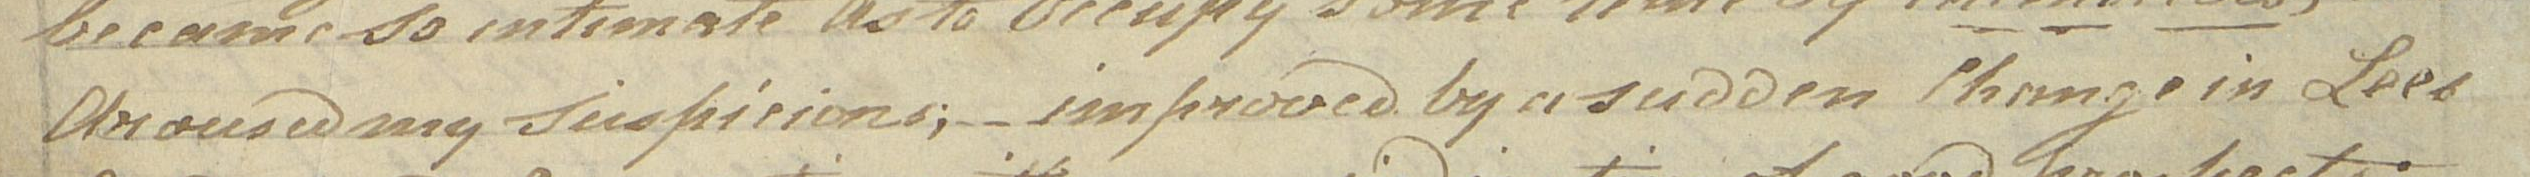Aroused my suspicions; improved by a sudden Change in Lees
